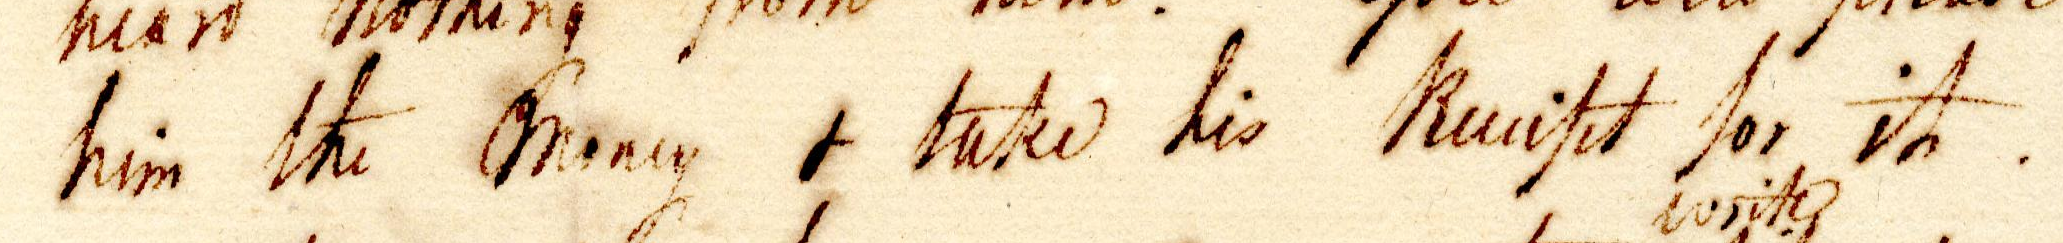him the money & take his Receipt for it.
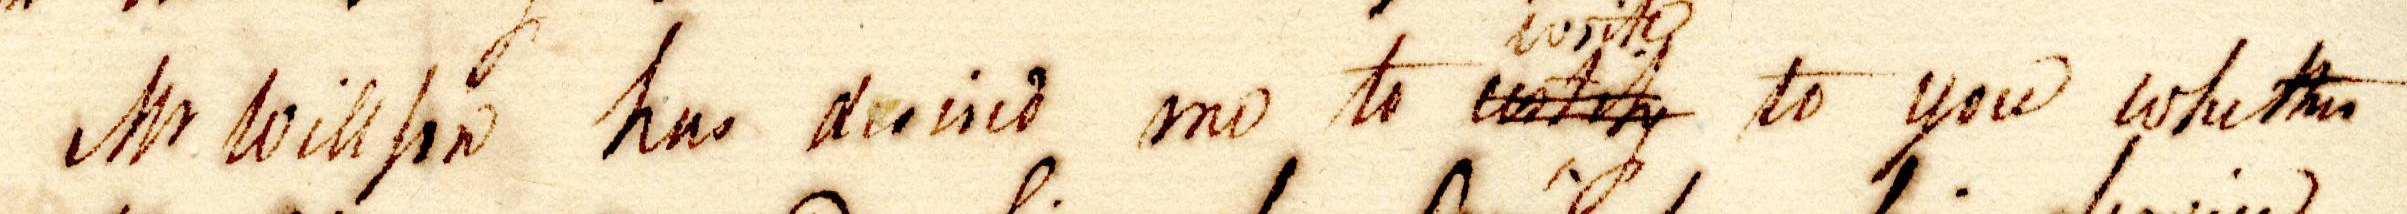M^r Willson has desired me to ^ until to you whether
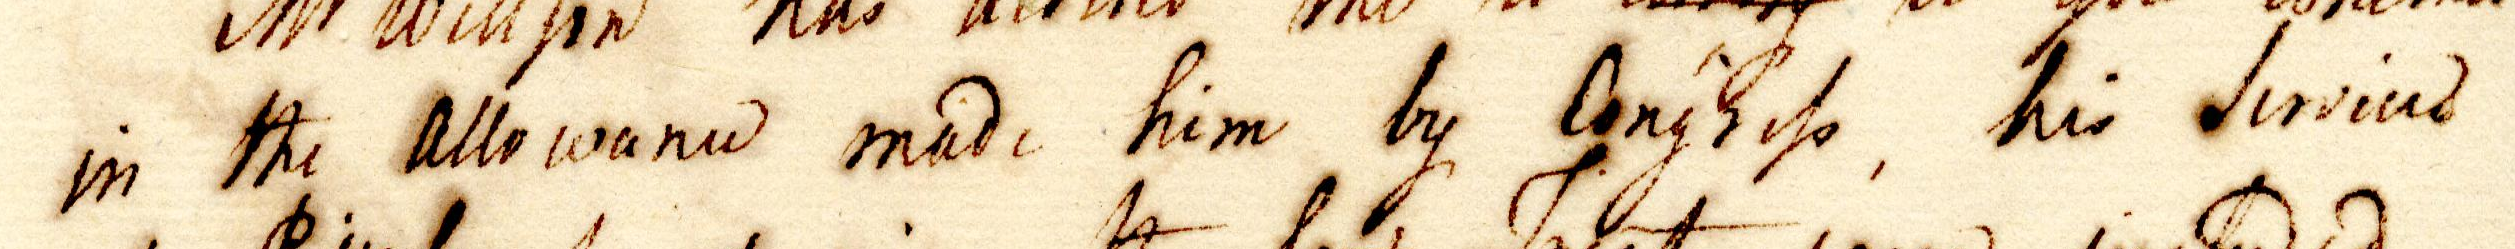in the allowance made him by Congess his Services
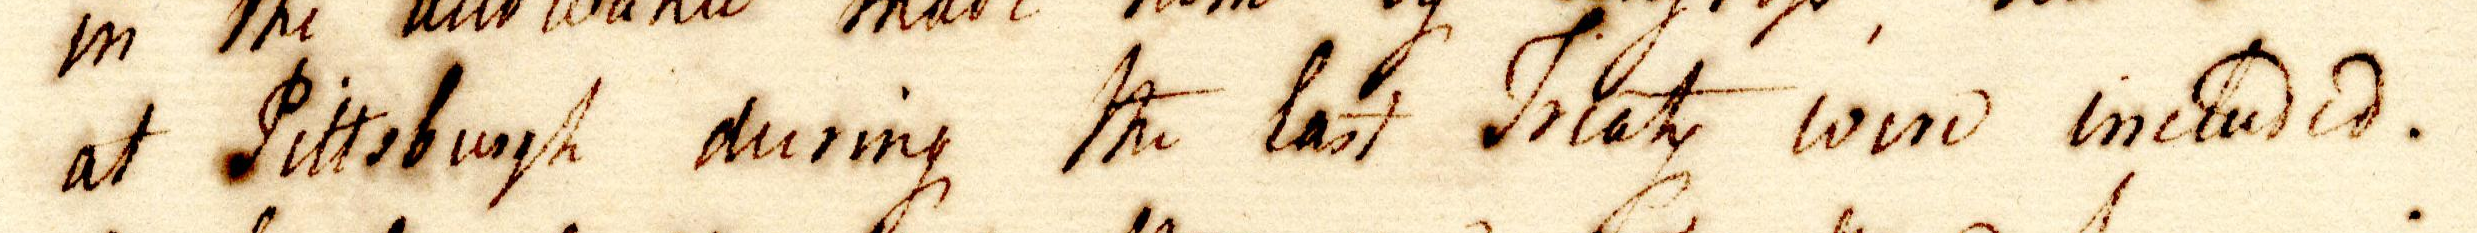at Pittsburgh during the last Treaty were included.
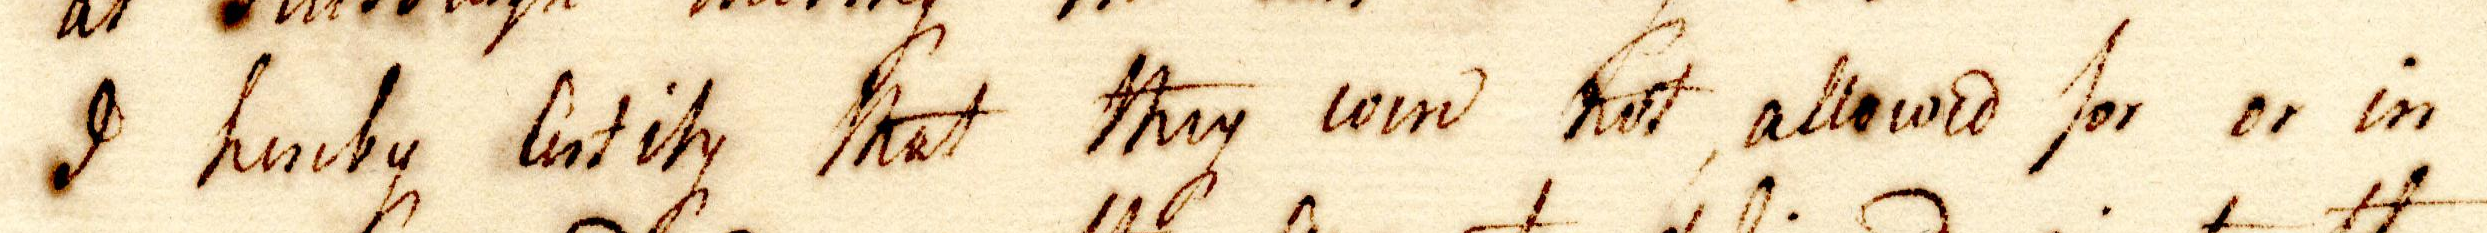I hereby certify that they were not allowed for or in
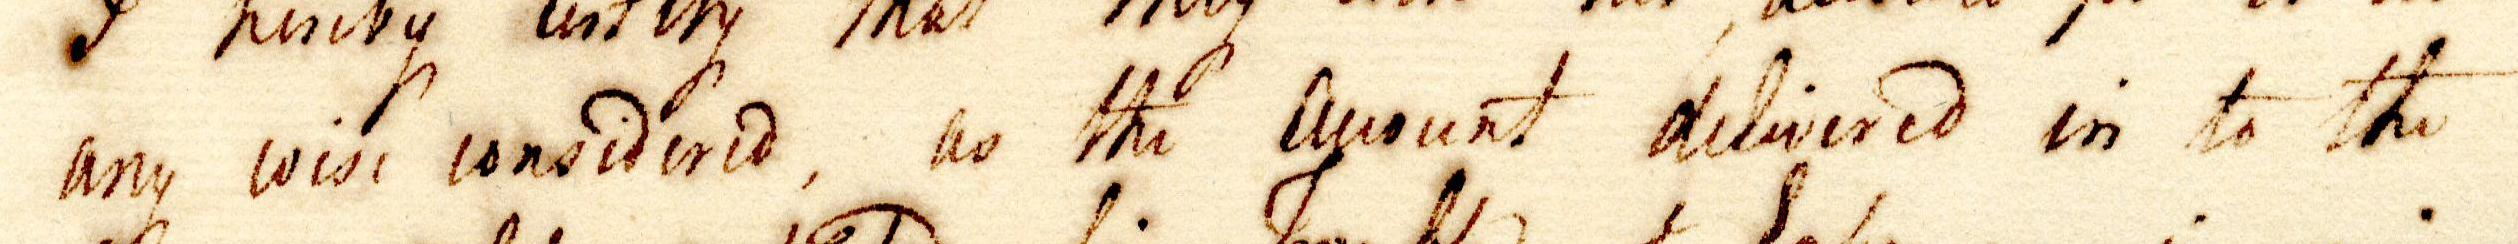any wise considered, as the Account delivered in to the
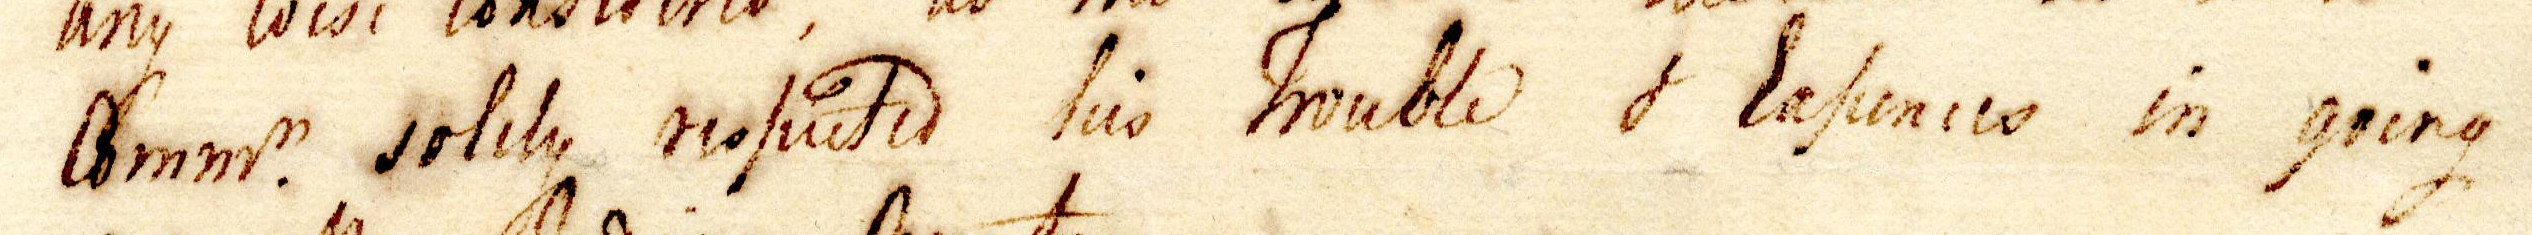Comm^r. solely respected his Trouble & Expenses in going
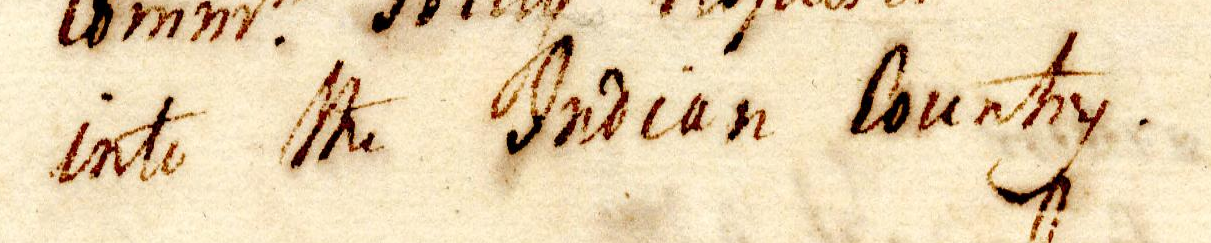into the Indian Country.
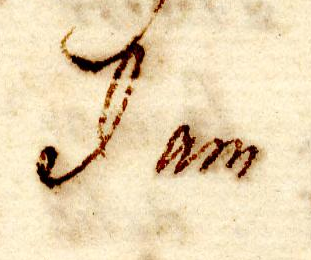I am
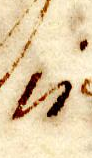Sir
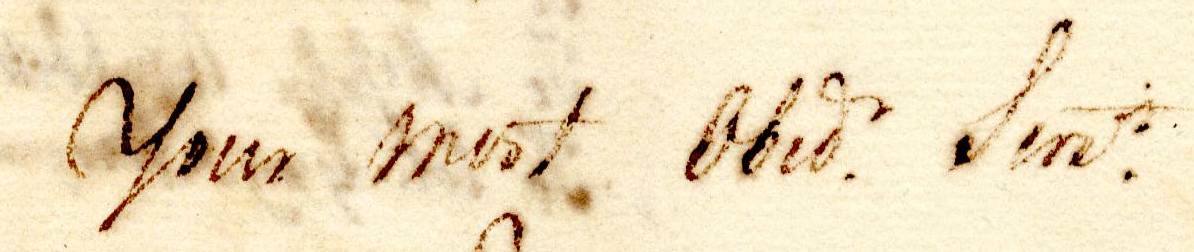Your most Obed^t. Serv^t.
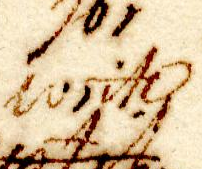write
